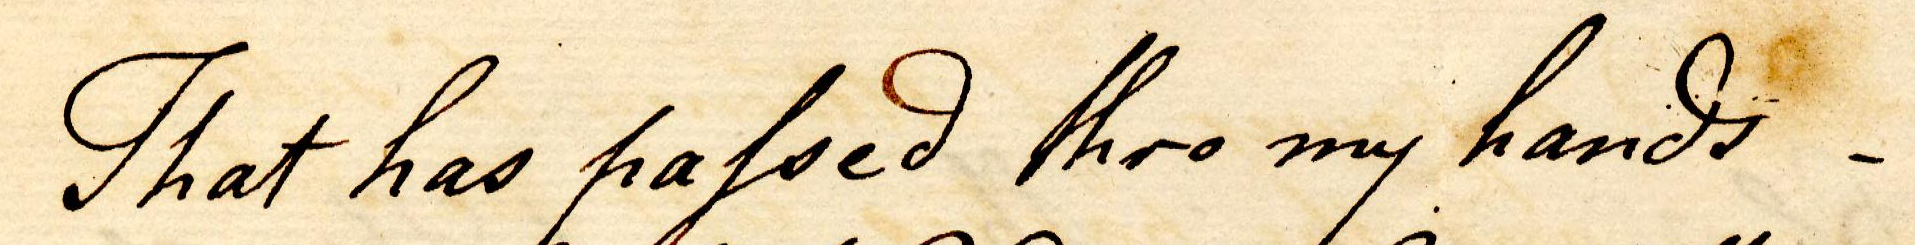That has passed thro my hands.
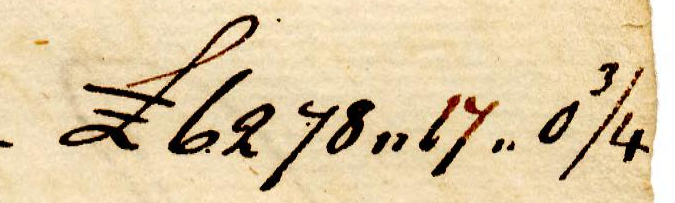£6278..17..0 3/4
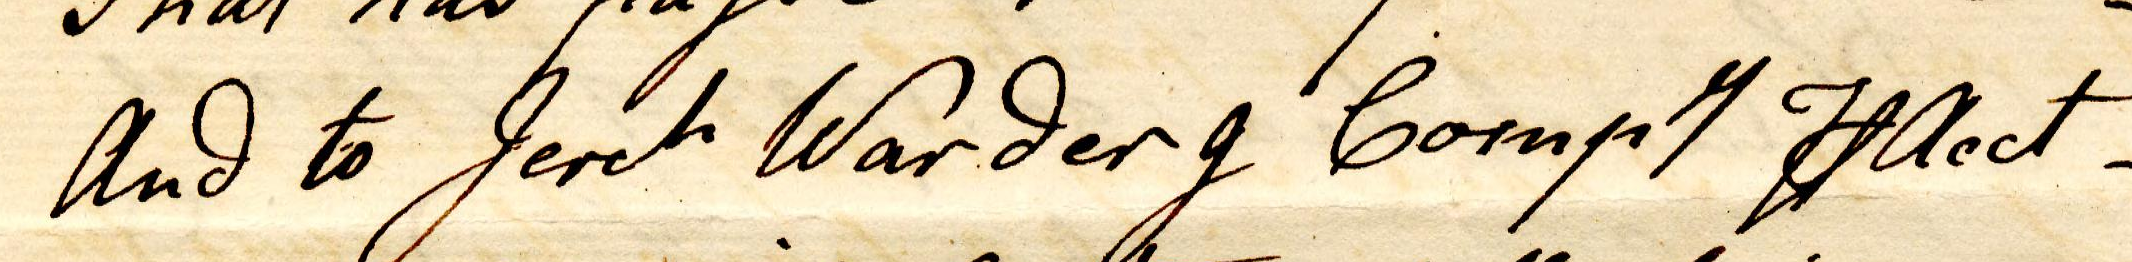And to Jere^h. Warder & Comp^y per Acct
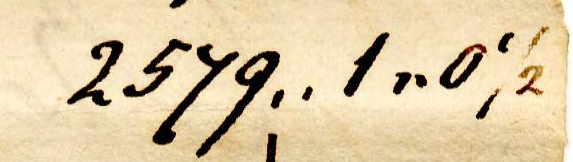2579.. 1.. 0 1/2
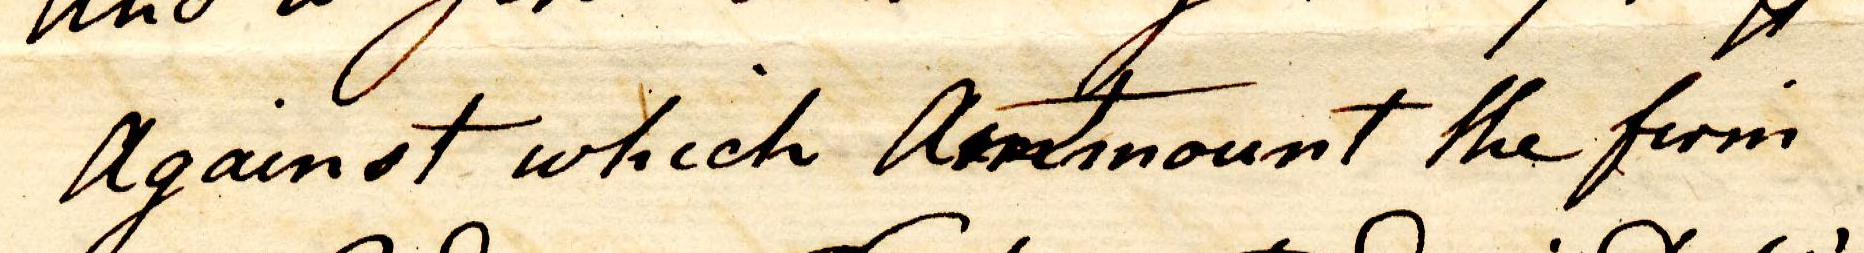Against which Ammount the firm
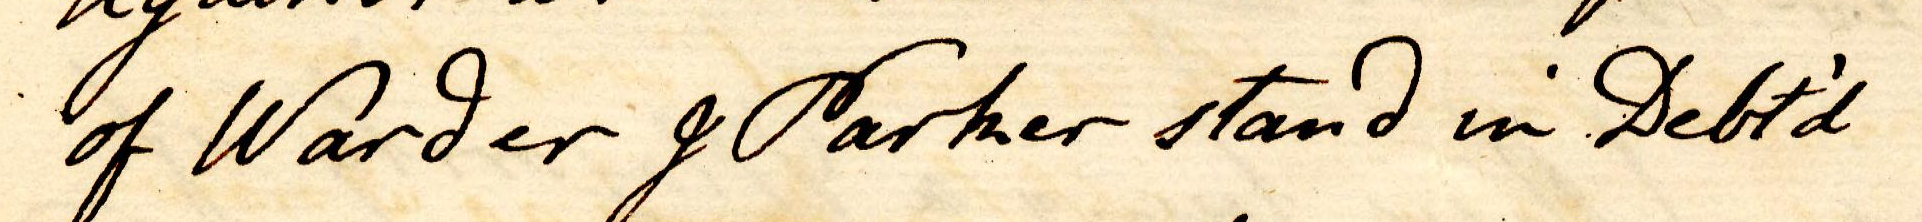of Warder & Parker stand in Debt'd
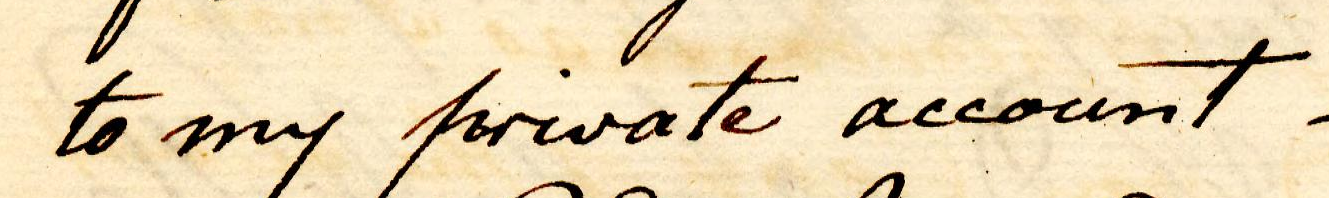to my private account
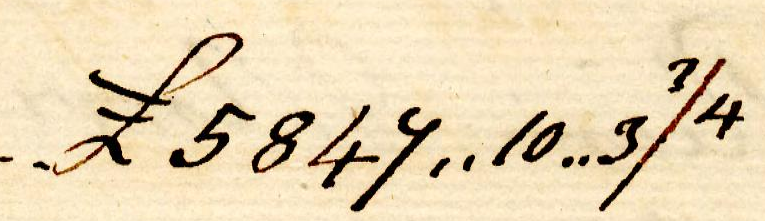£5849.. 10.. 3 3/4
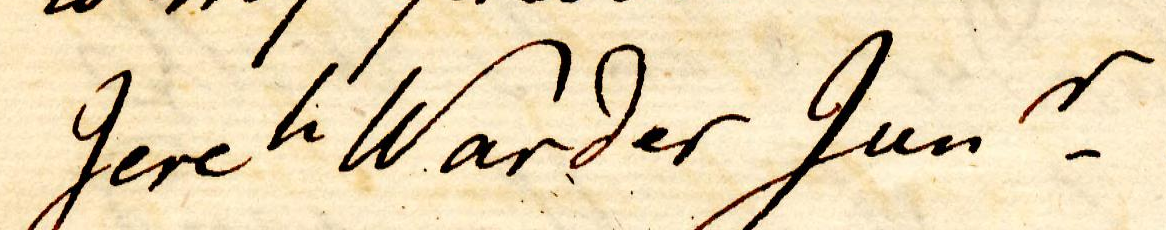Jere^h. Warder Jun^r
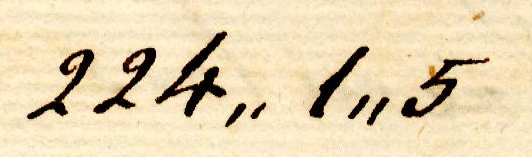224.. 1.. 5
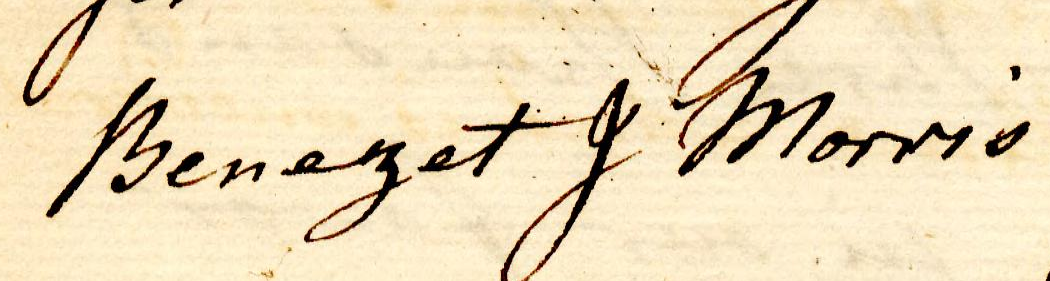Benezet J Morris
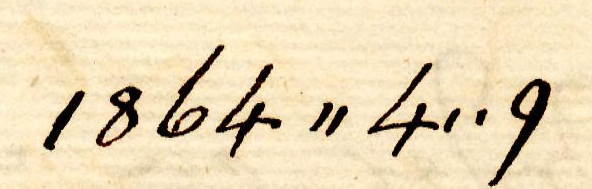1864.. 4..9
